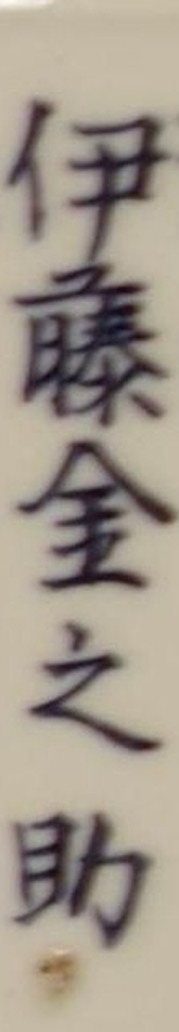伊藤金之助
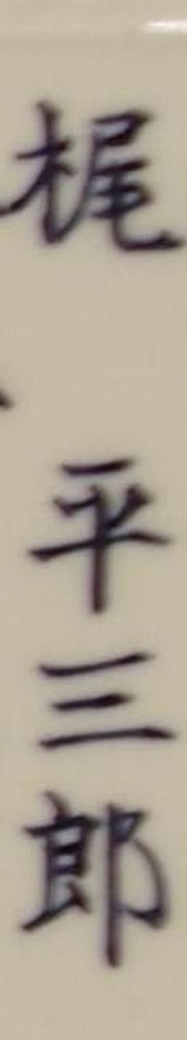梶平三郎
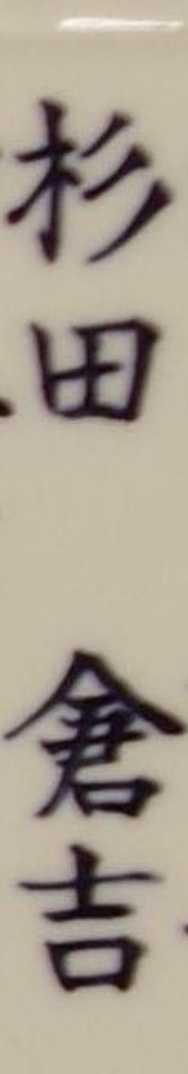杉田倉吉
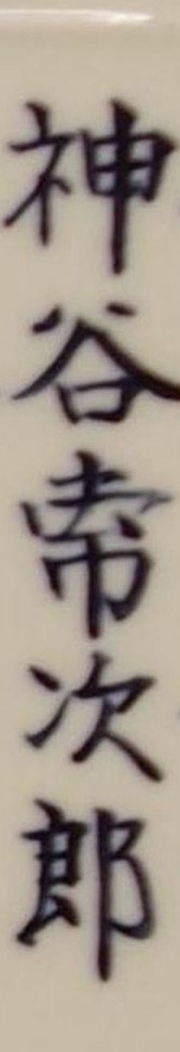神谷常次郎
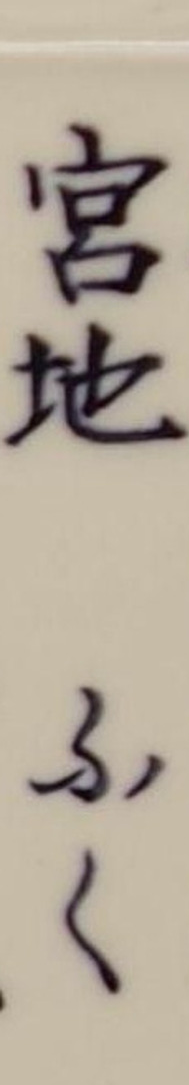宮地ふく
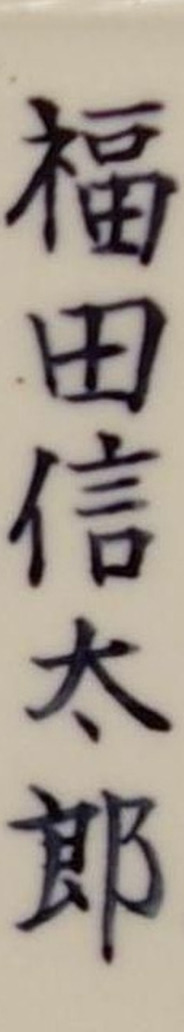福田信太郎
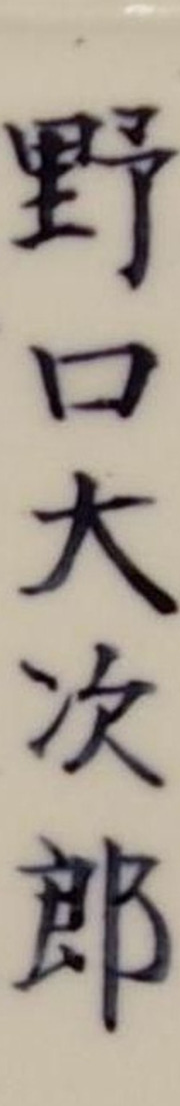野口大次郎
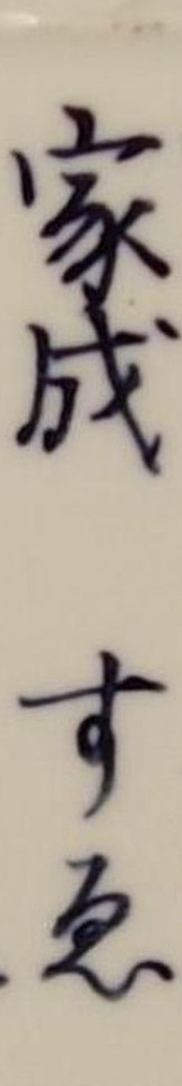家成すえ
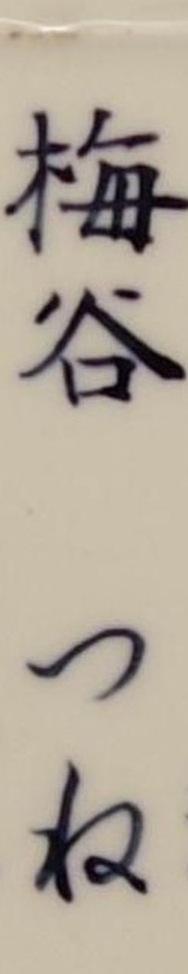梅谷つね
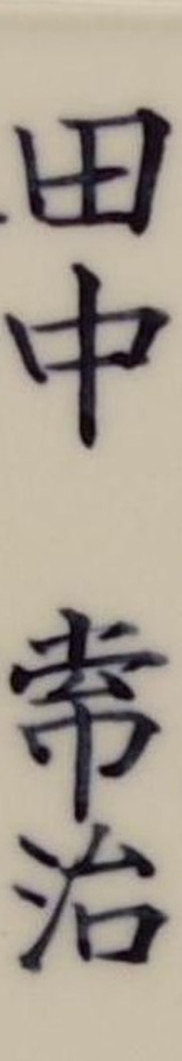田中常治
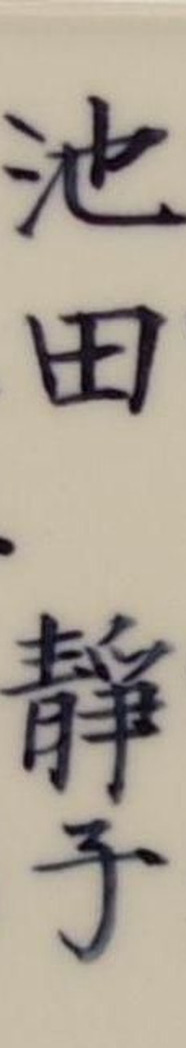池田静子
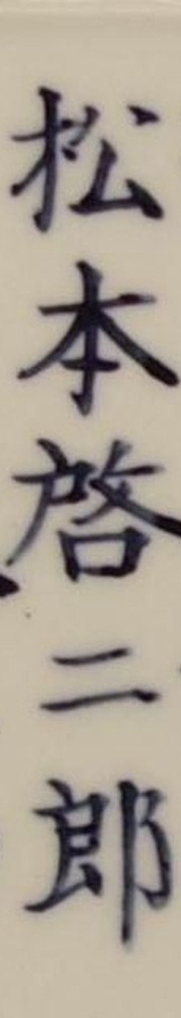松本啓二郎
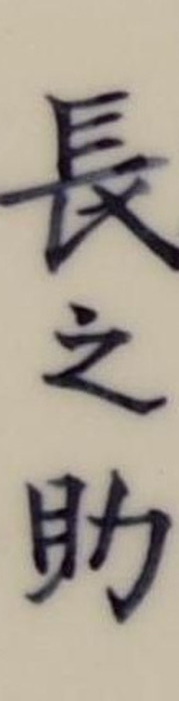長之助
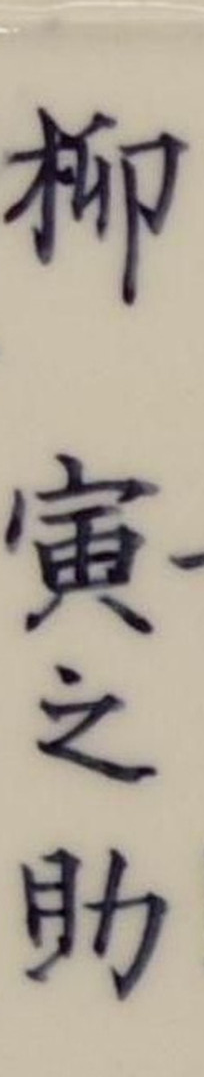柳寅之助
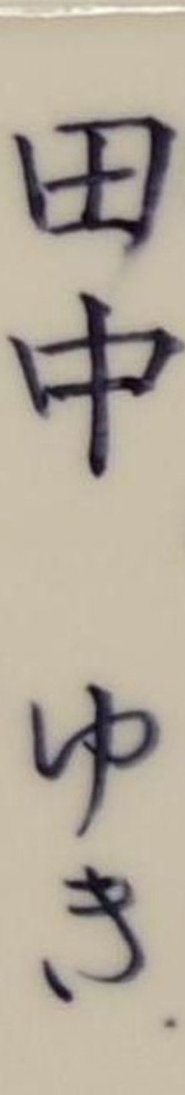田中ゆき
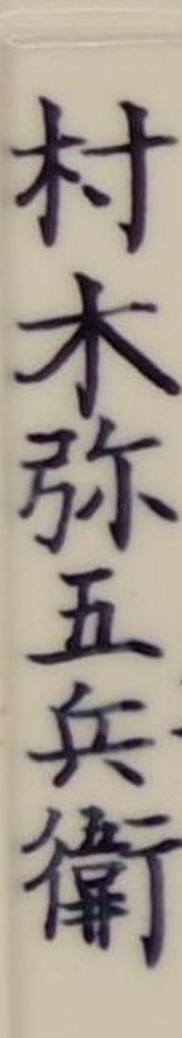材木弥五兵衛
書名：M~S
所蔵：高野山金剛峯寺
